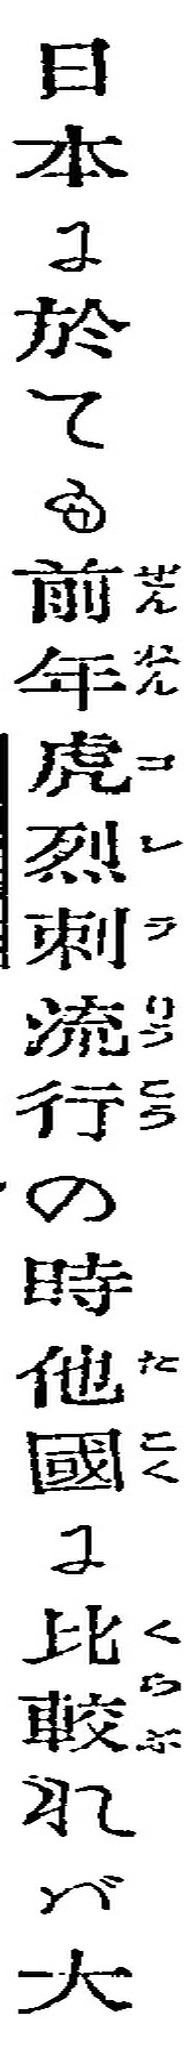日本に於いても前年虎列刺流行の時他国に比較れば大
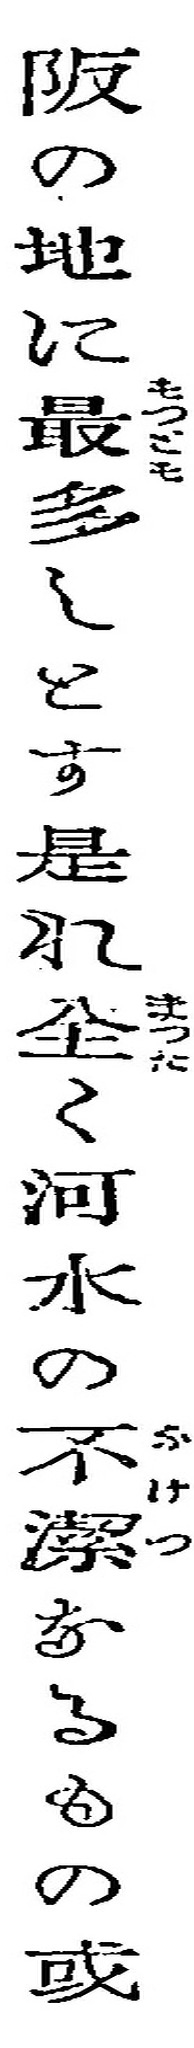阪の地に最多しとす是全く河水の不潔なるもの或
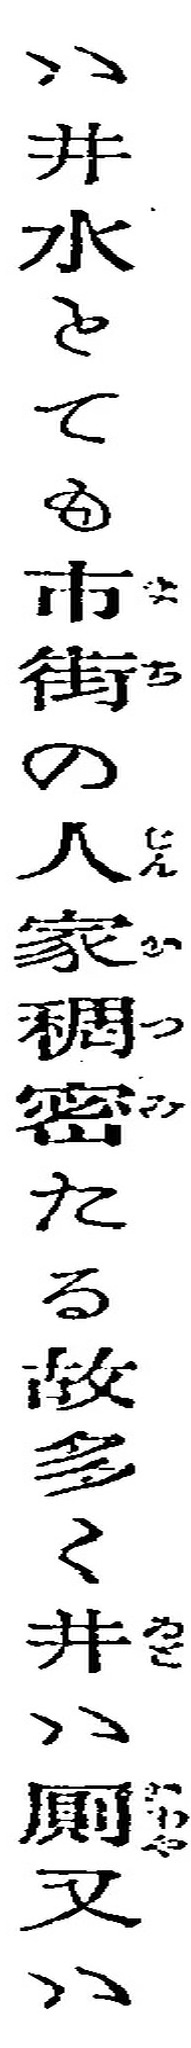は井水とても市街の人家稠蜜たる故多く厠又は
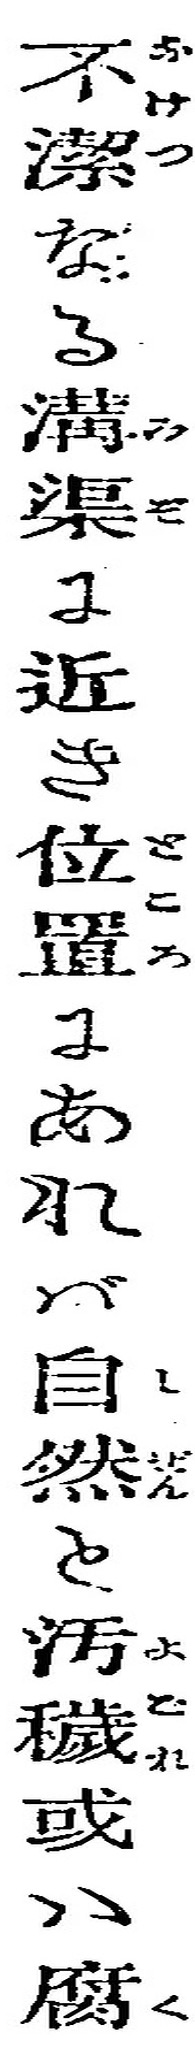不潔なる溝渠に近き位置にあれば自然と汚穢或は腐

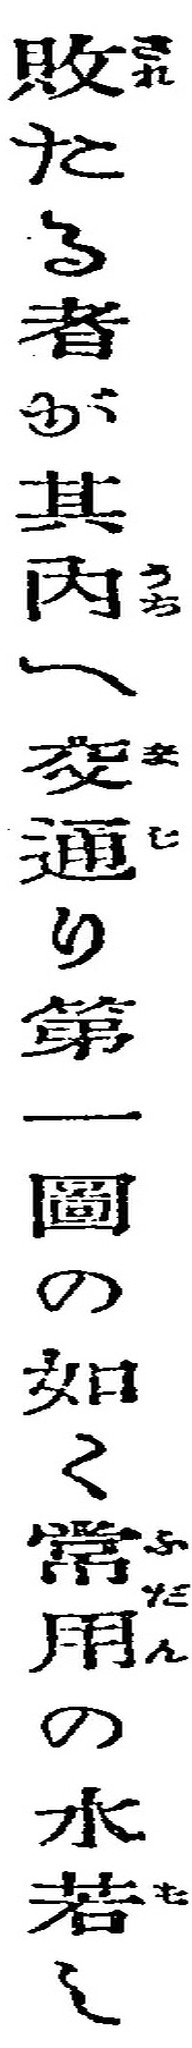敗たる者が其内へ交通り第一圖の如く常用の水若し
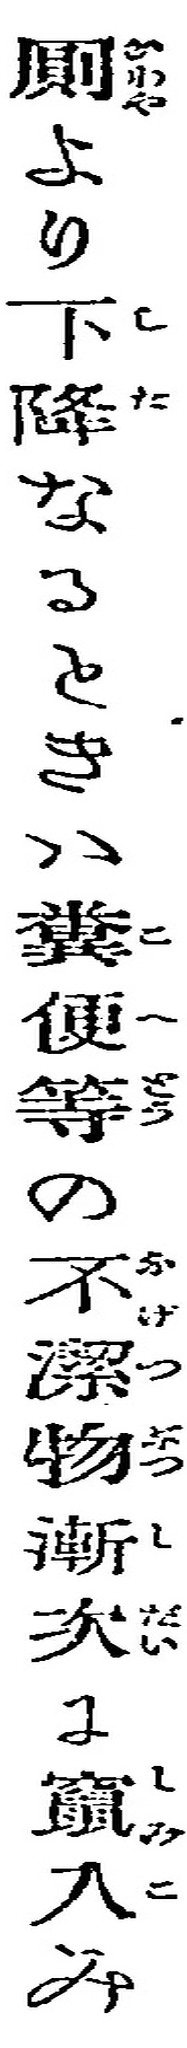厠より下降なるときは糞便等の不潔物漸次に竄入み
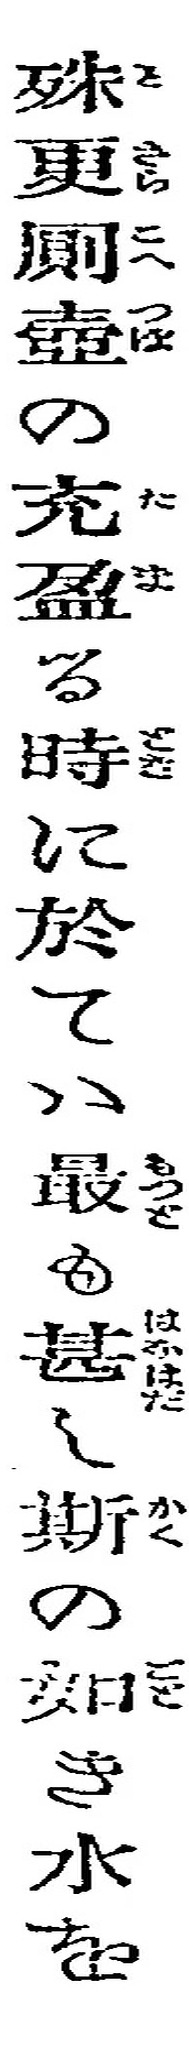殊更厠壺の充盈る時に於いて最も甚し斯の如き水を
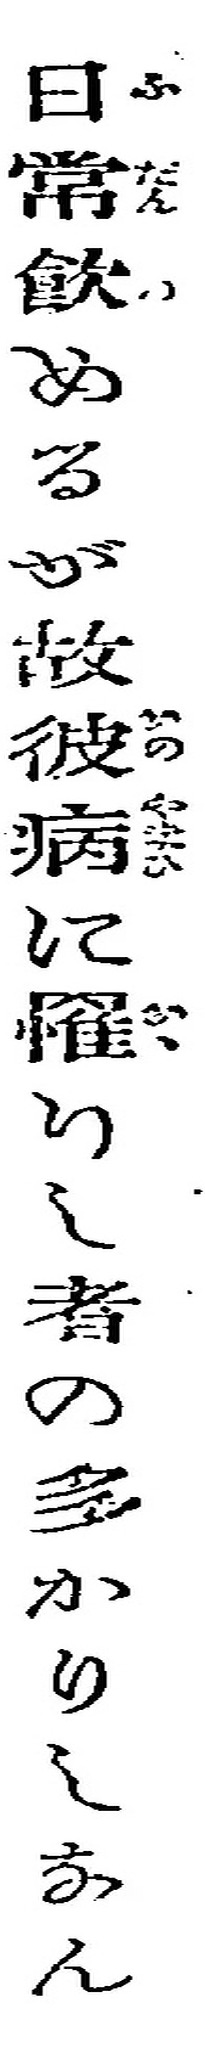日常飲めるが故彼病に罹りし者の多かりしなん
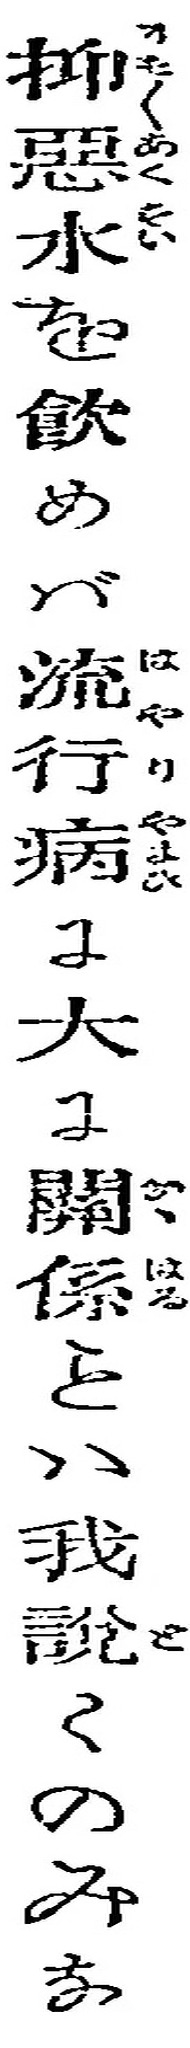抑惡水を飲めば流行病んい大に関係ことは我説くのみな
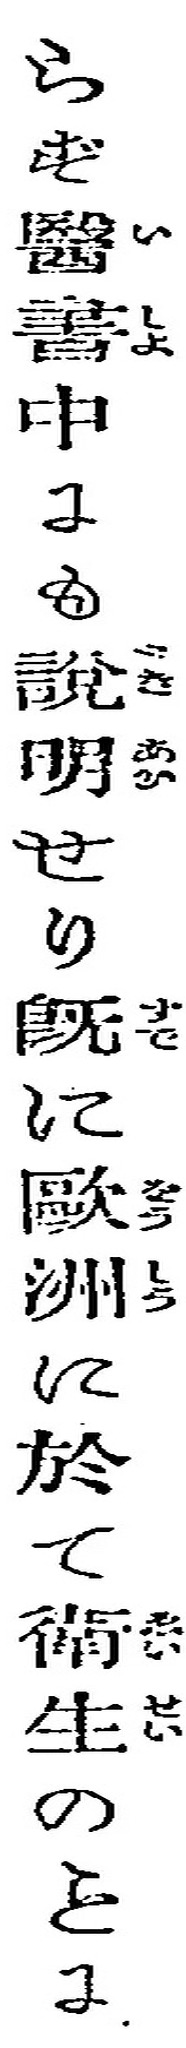らず醫書中にも説明せり既に歐洲に於て衛生のことに
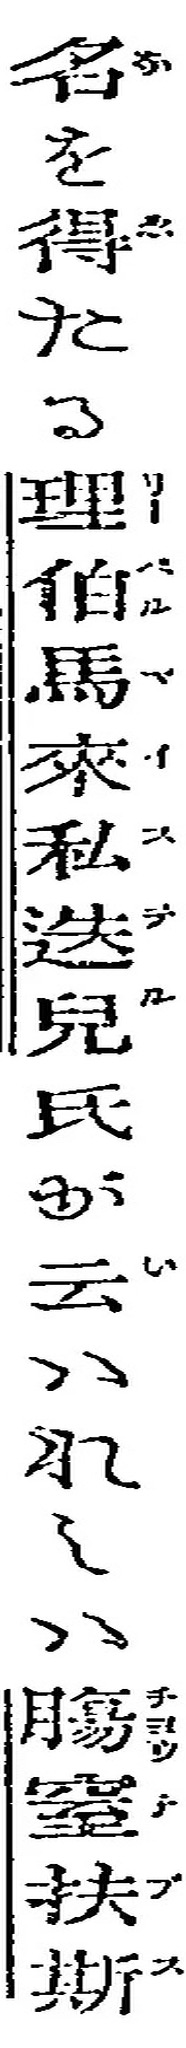名を得たる理伯馬來私送兒氏が云はれしは腸窒扶斯
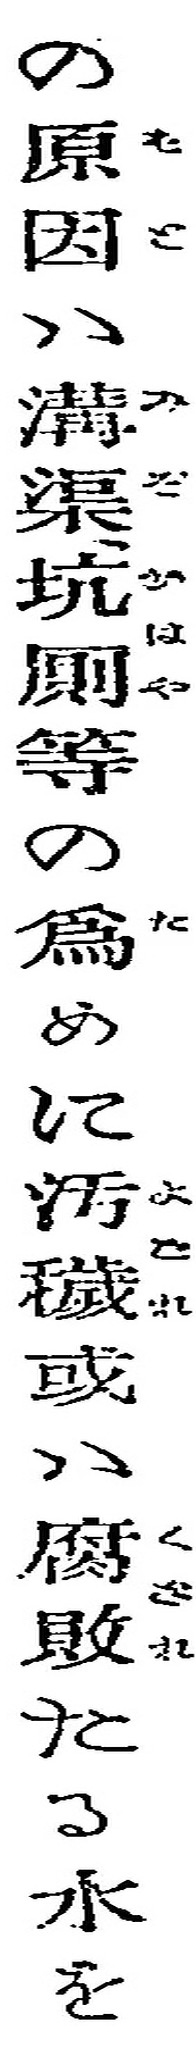の原因は溝、坑厠等の為めに汚穢或は腐敗たる水を
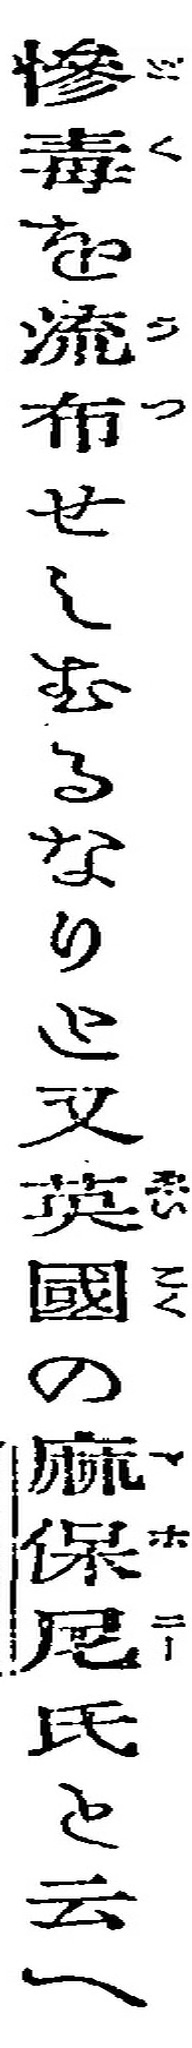慘毒を流布せしむるなりと又英国の麻保尼氏と云へ
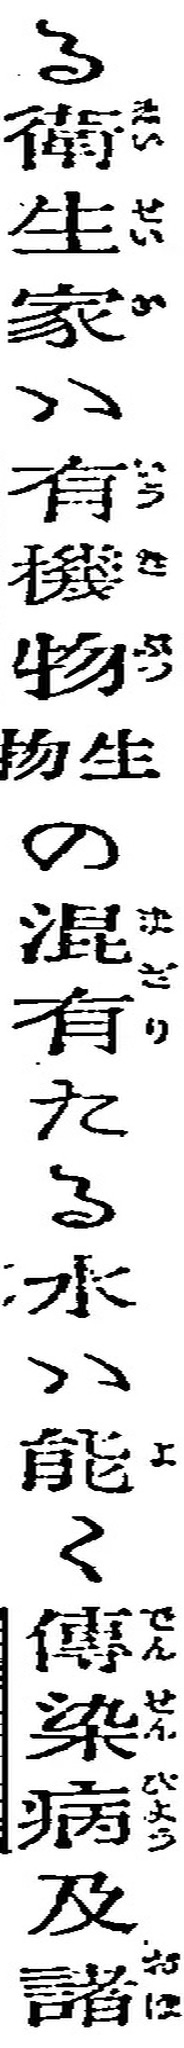る衛星家は有機物生物の混有たる水は能く傅染病及び諸
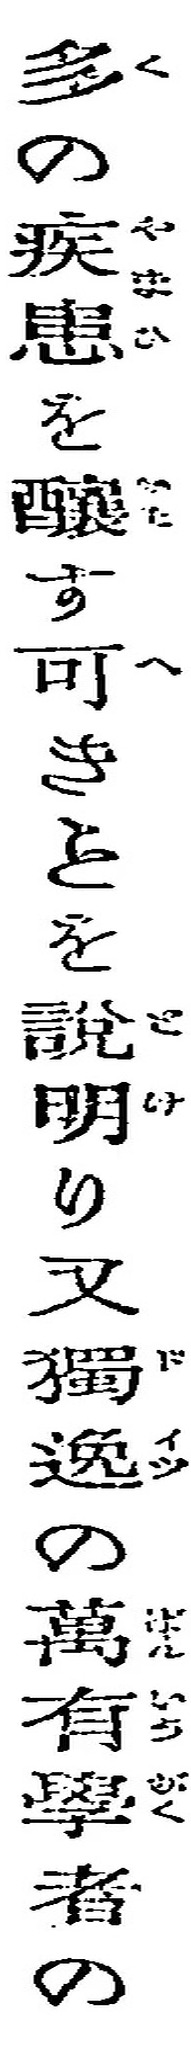多の疾患を醸す可きことを説明り又独逸の萬有學者の
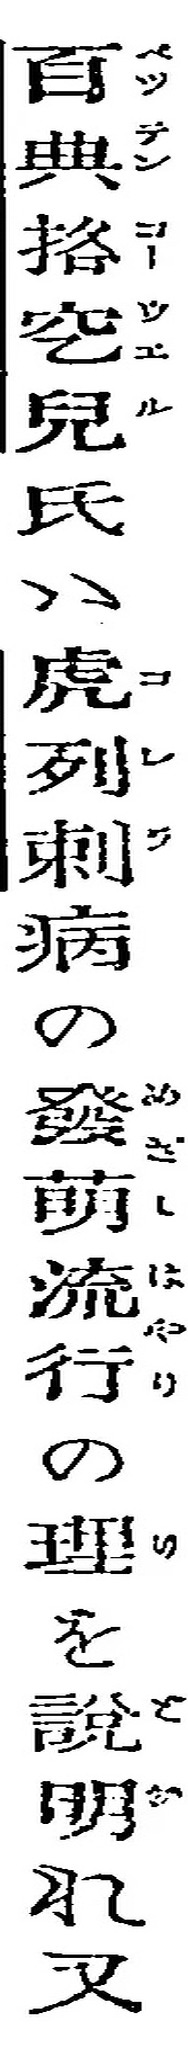百典挌穵兒氏は虎列刺病の發萌流行の理を説明れ又
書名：飲水の心得 : 伝染病の予防
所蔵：国立国会図書館 National Diet Library, JAPAN
